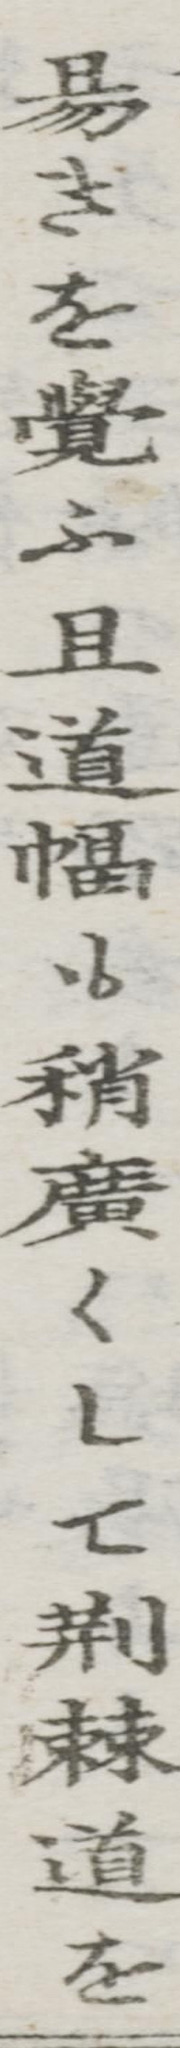易きを覺ふ且道幅も稍廣くして荊棘道を
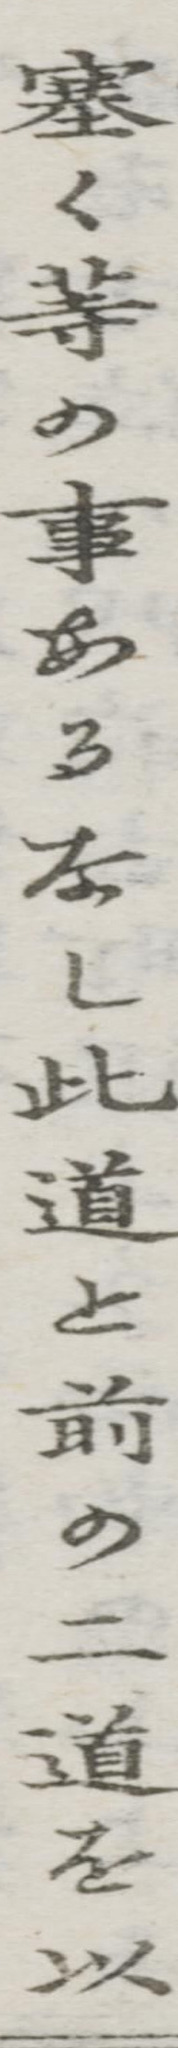塞く等の事あるなし此道と前の二道を以
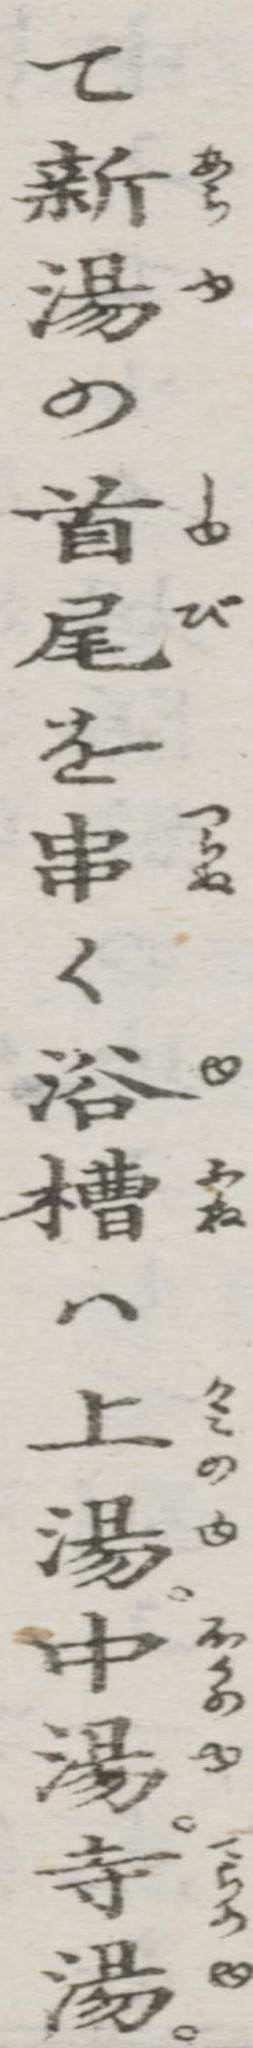て新湯の首尾を串く浴槽は上湯。中湯。寺湯。
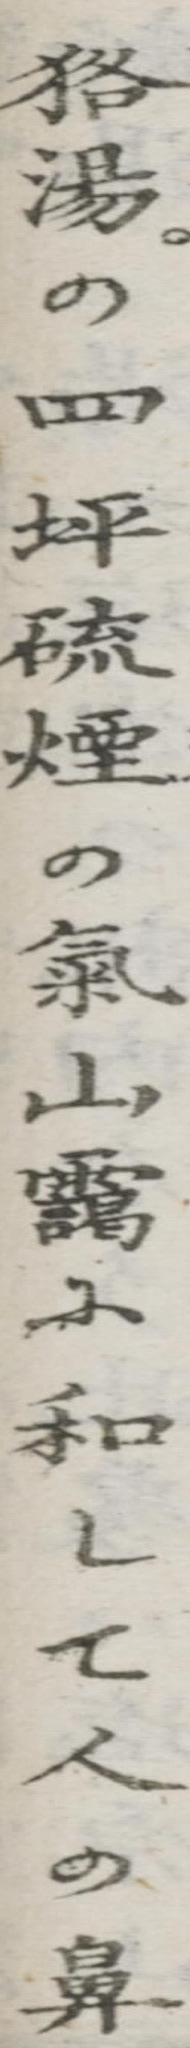貉湯。の四坪硫煙の氣山靄に和して人の鼻
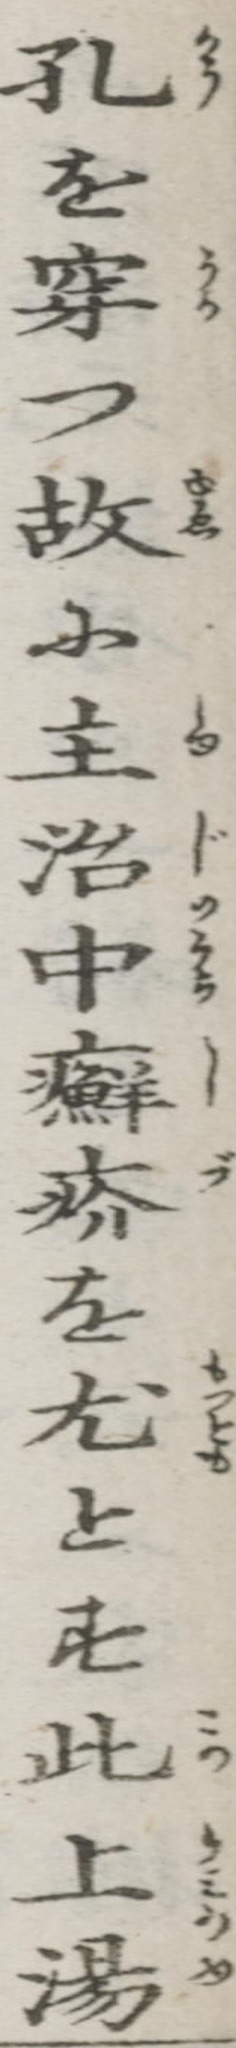孔を穿つ故に主治中癬疥を尤とす此上湯
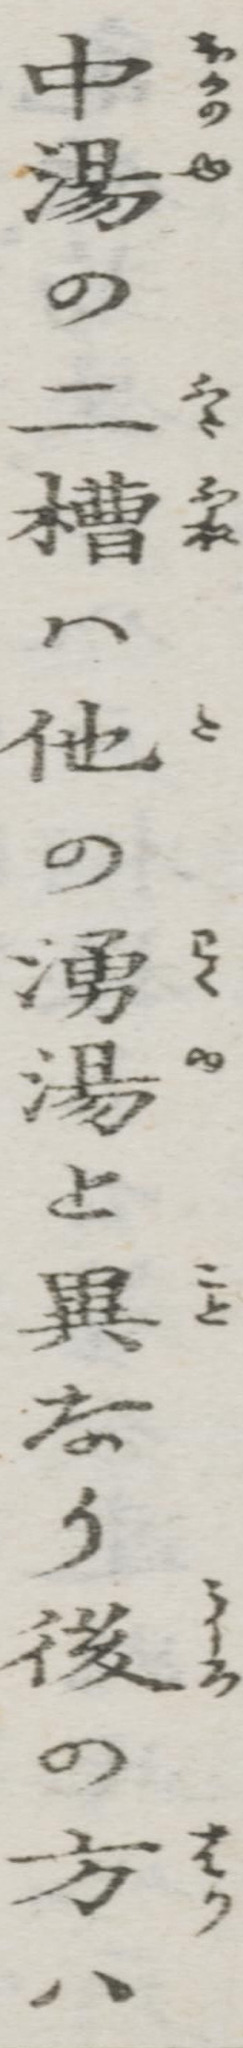中湯の二槽は他の湧湯と異なり後の方は
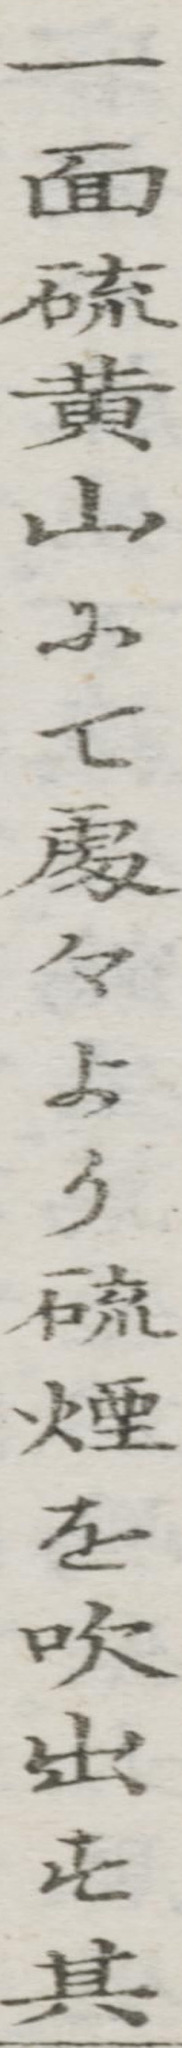一面硫黄山にて處々より硫煙を吹出す其
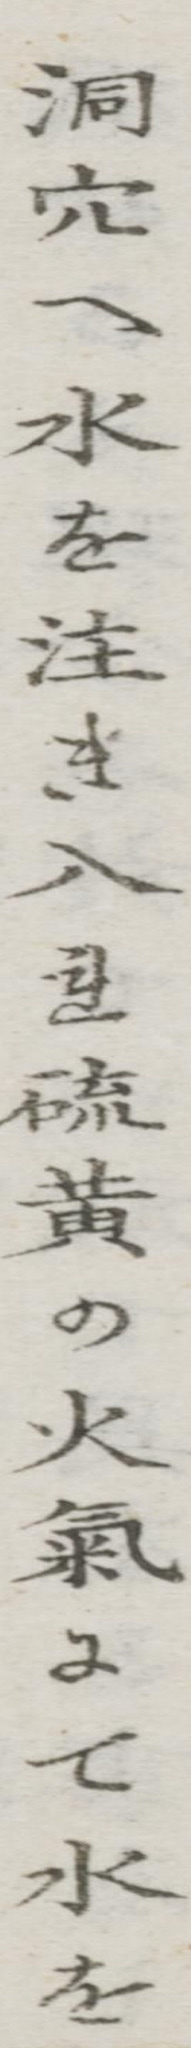洞穴へ水を注き入れ硫黄の火氣にて水を
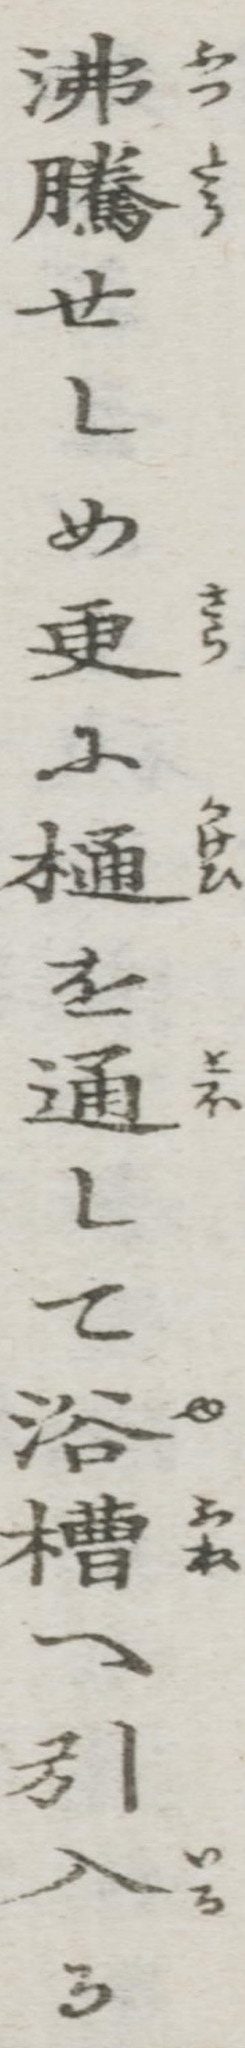沸騰せしめ更に樋を通して浴槽へ引入る
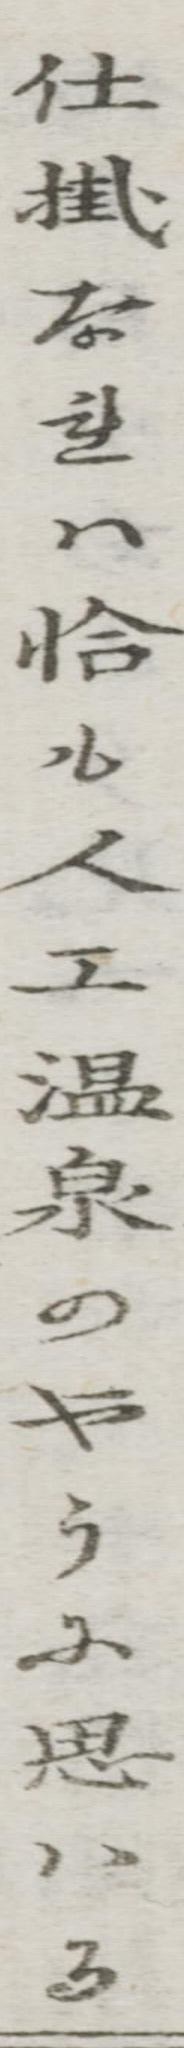仕掛なれは恰も人工温泉のやうに思はる
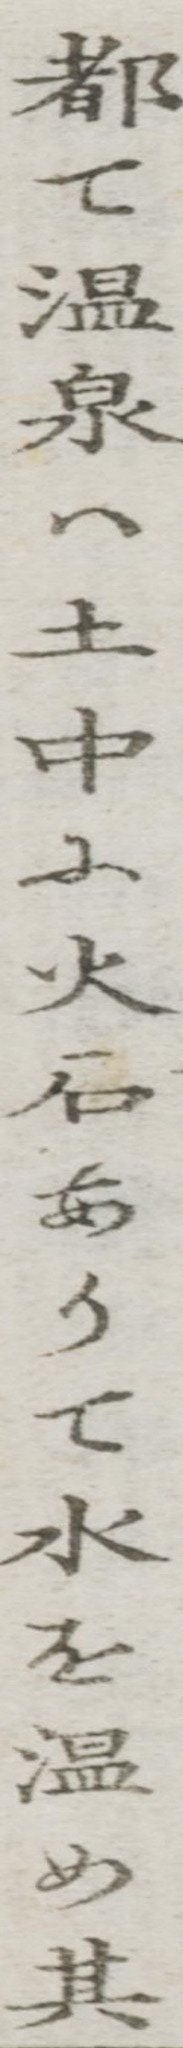都て温泉は土中に火石ありて水を温め其
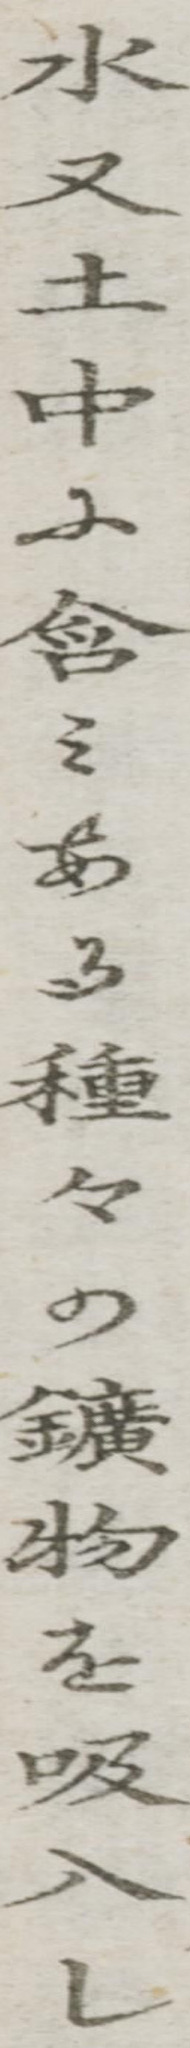水又土中に含みある種々の鑛物を吸入し

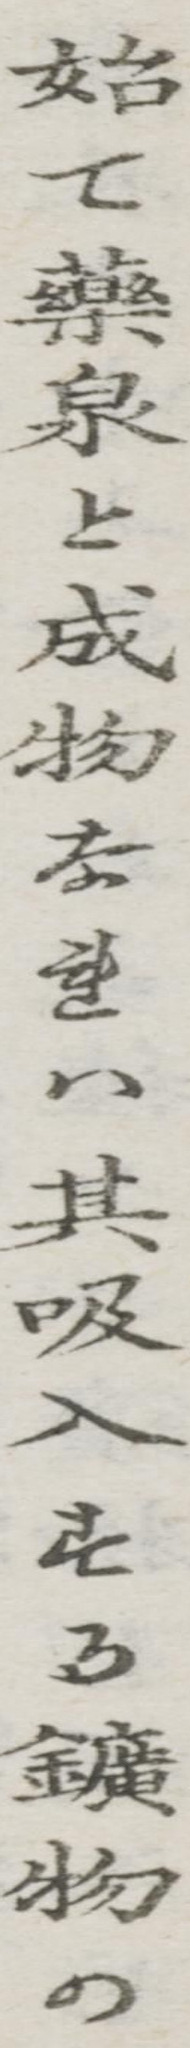始て薬泉と成物なれは其吸入する鑛物の
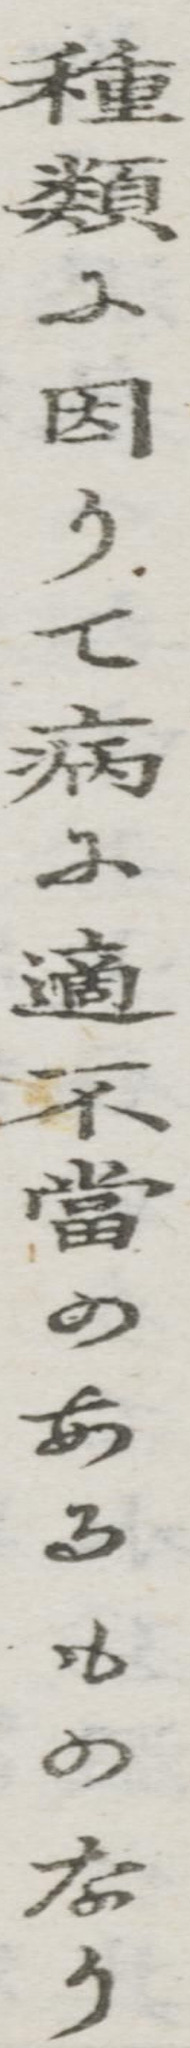種類に因りて病に適不當のあるものなり
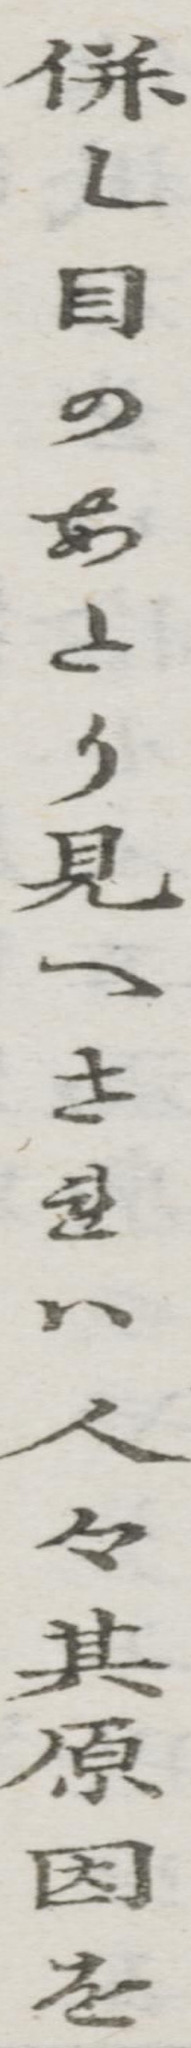併し目のあたり見へされは人々其原因を
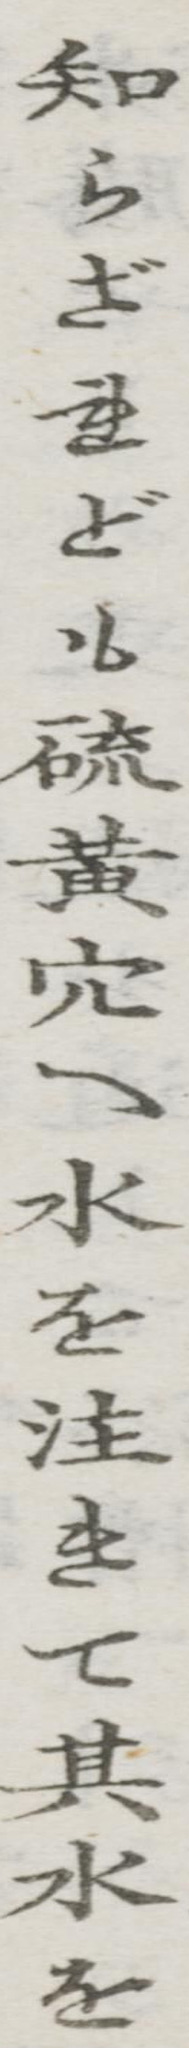知らざれども硫黄穴へ水を注きて其水を
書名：塩原繁昌記　全
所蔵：東京大学地震研究所図書室 Earthquake Research Institute Library, The University of Tokyo, JAPAN
